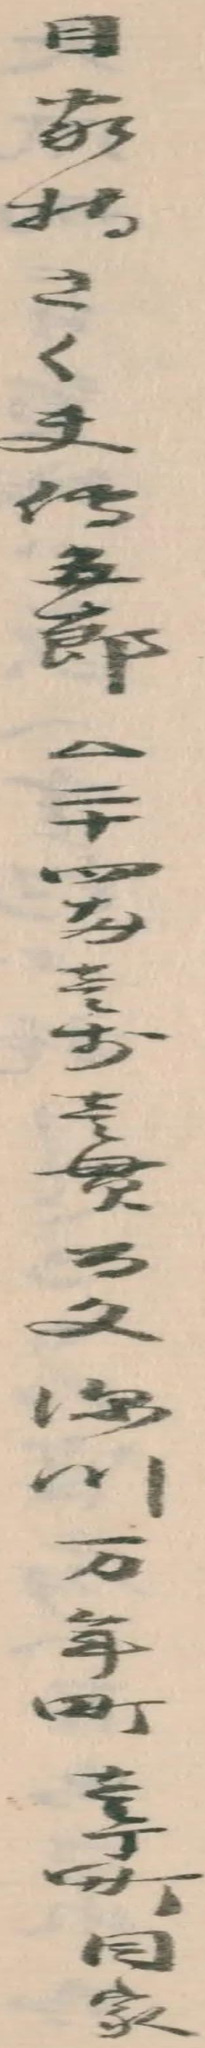目家持さく夫伝五郎△二十四両壱歩壱貫百文深川万年町壹丁町目家
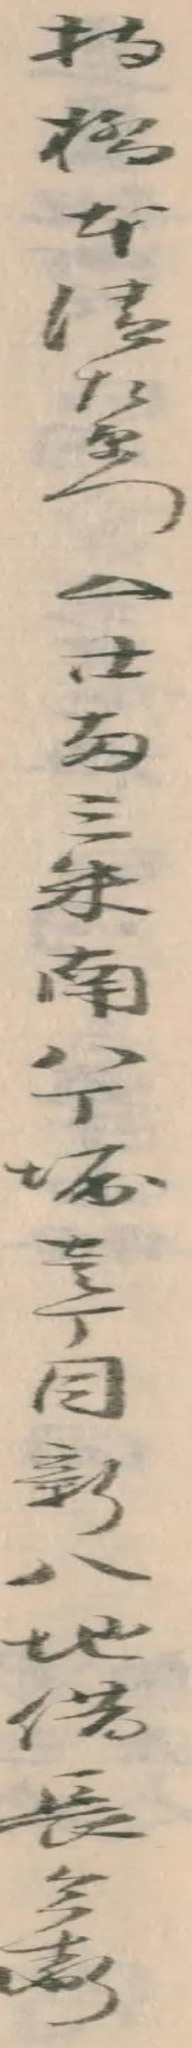持橋本清左衛門△廿両三朱南八丁堀壱丁目新八地借長兵衛
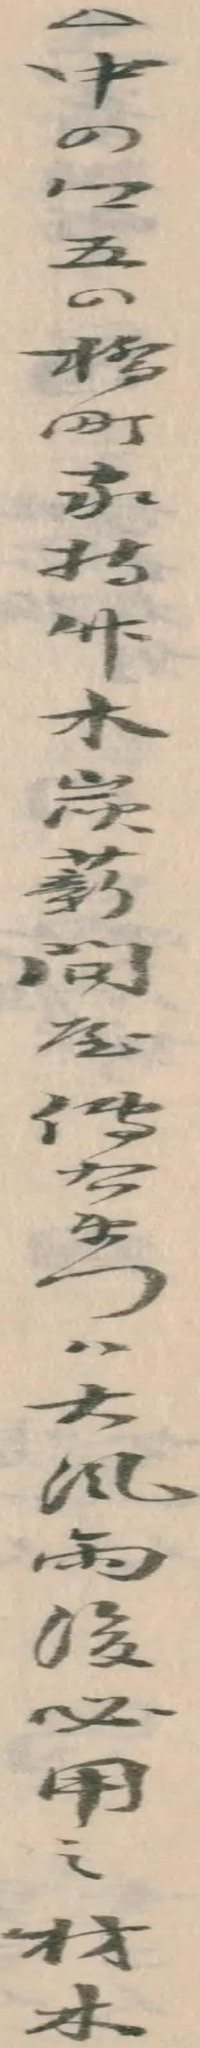△中の郷五の橋町家持竹木炭薪問屋伝右衛門は大風雨後必用之材木
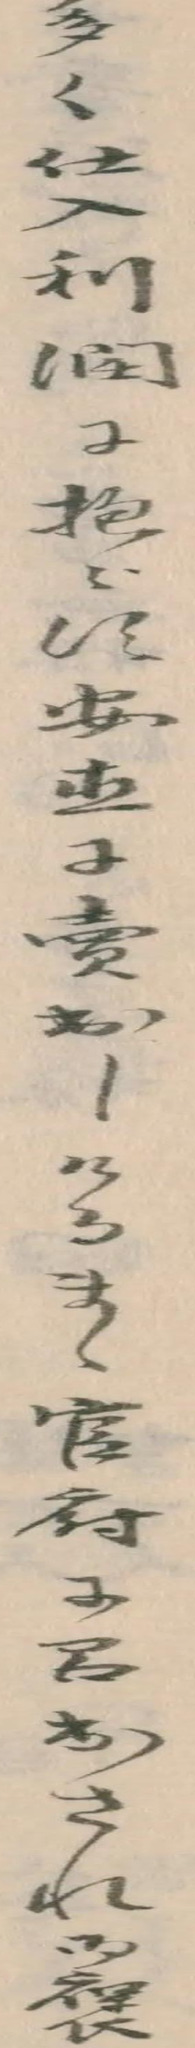多く仕入利潤に抱らす安直に売出しけるまゝ官府に召出され御褒
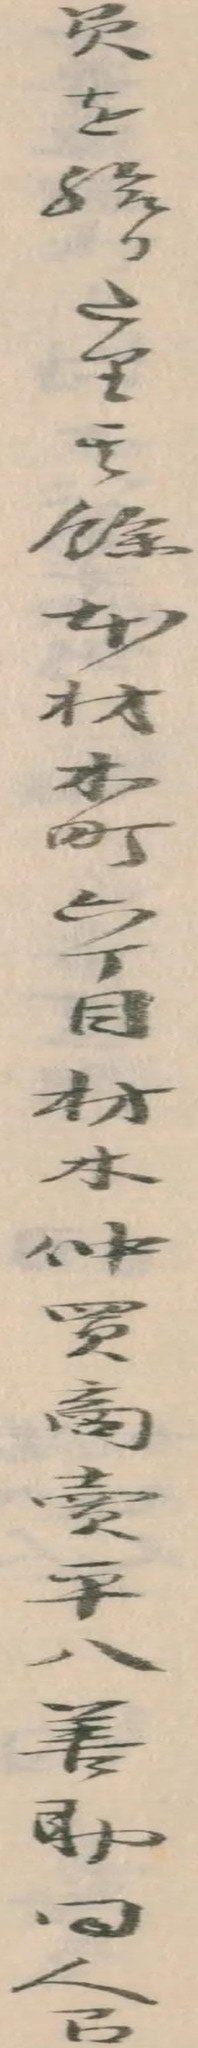美を給りたり其余本材木町六丁目材木仲買商売平八善助同人召
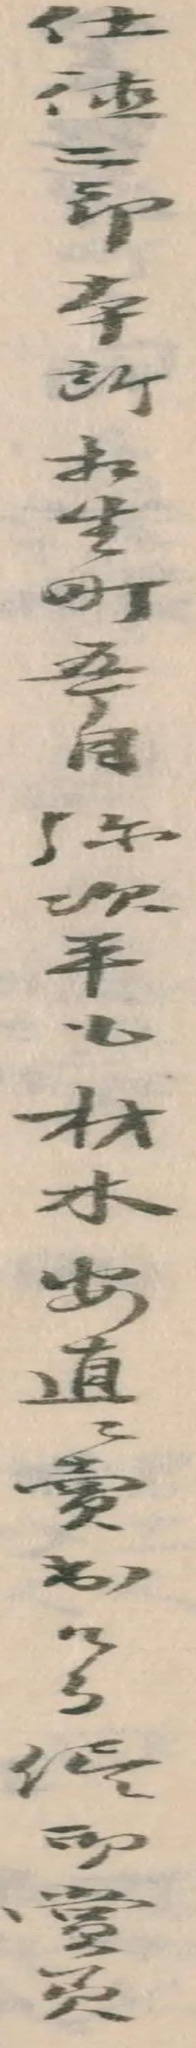仕徳二郎本所相生町五丁目弥次平も材木安直売出ける侭御賞美あり
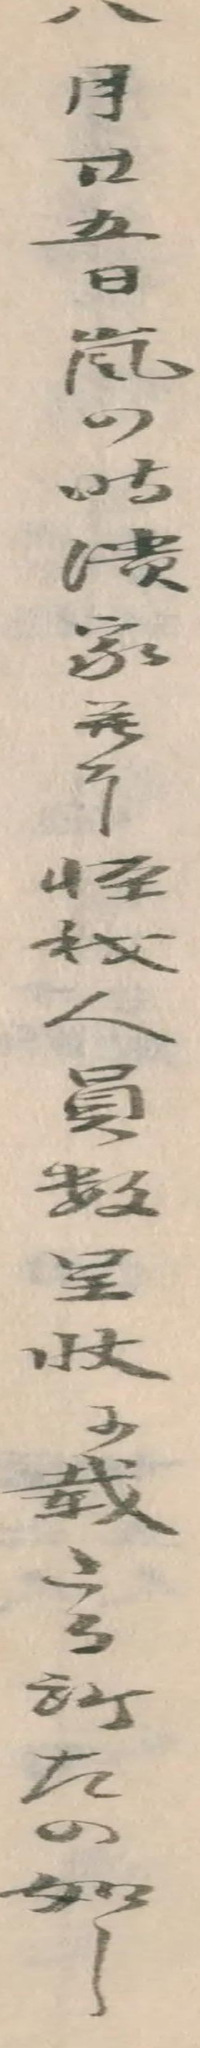八月廿五日嵐の時潰家并に怪我人員数呈状に載たる所左の如し
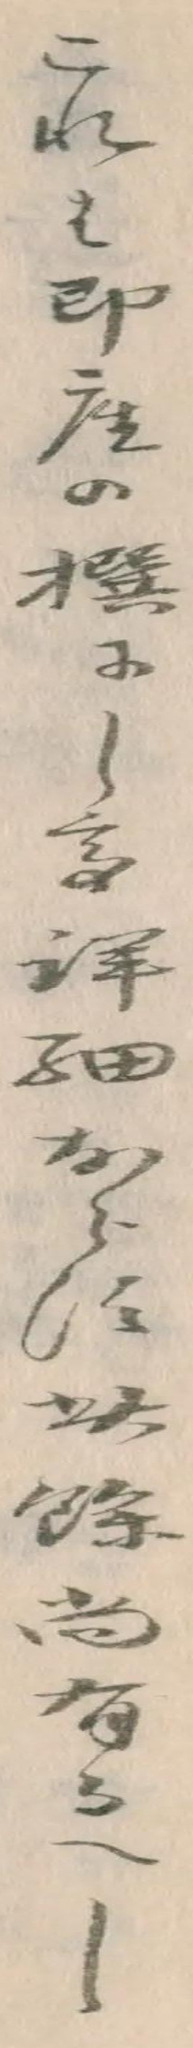これは即座の撰にして詳細ならす此余尚有るへし

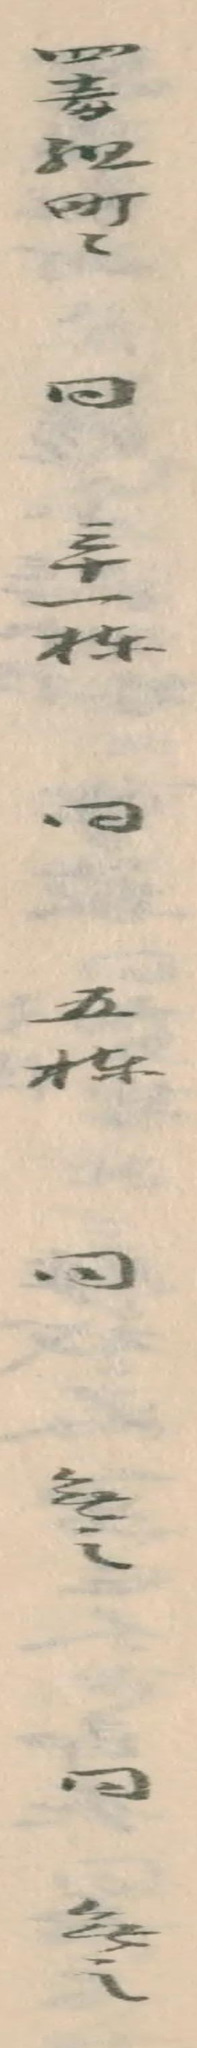四番組町々同三十一棟同五棟同無之同無之
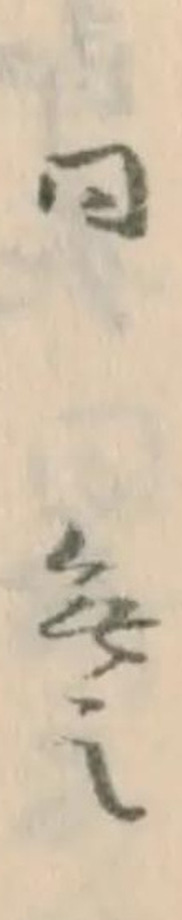同無之
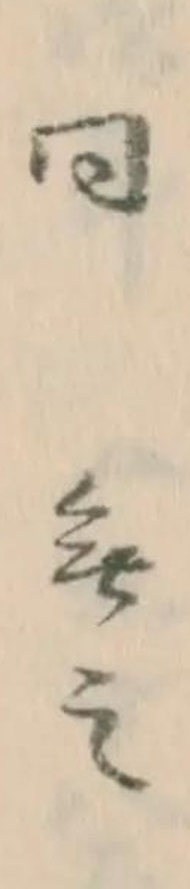同無之
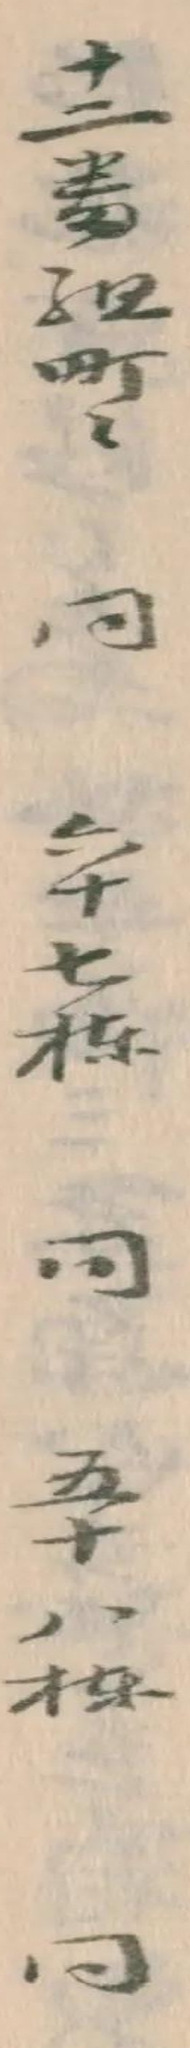十九番組町々同四十三棟同四十一棟同同同同
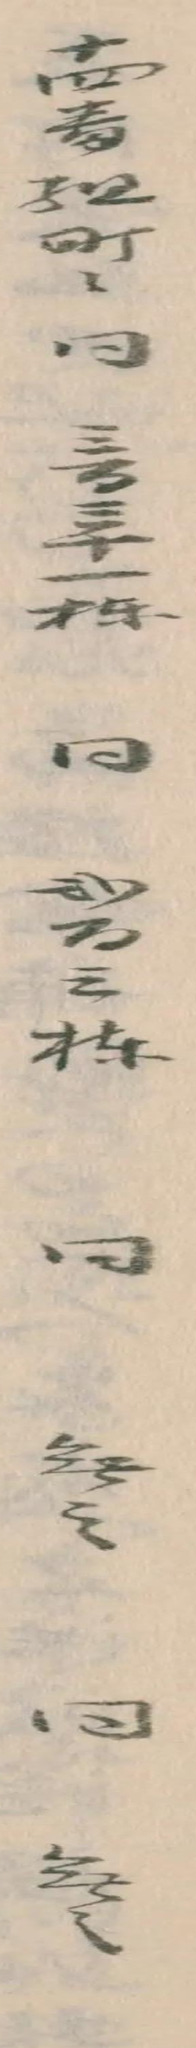十四番組町々同三百三十一棟同弐百三棟同無之同無之
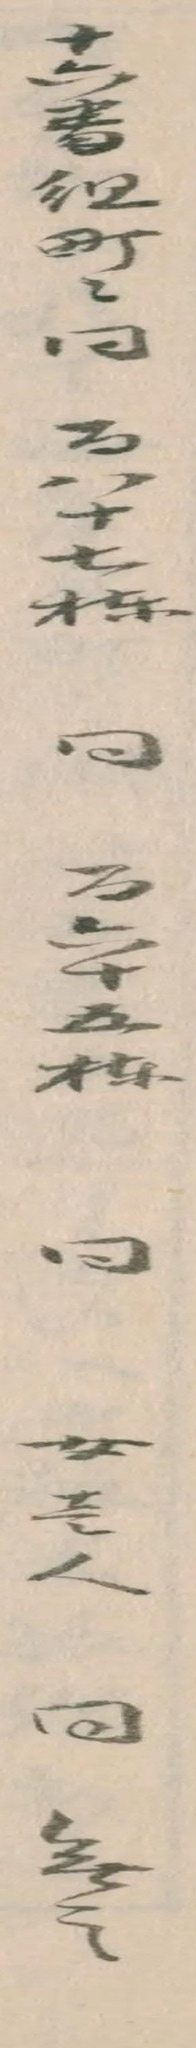十六番組町々同百八十七棟同百六十五棟同女壱人同無之
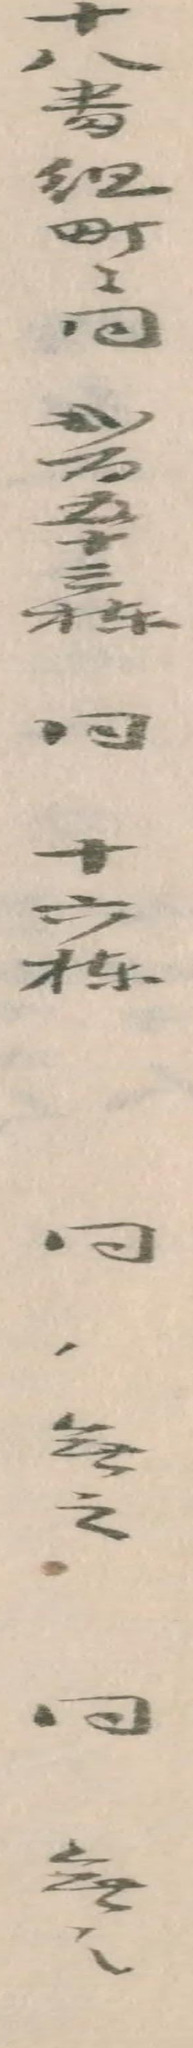十八番組町々同弐百五十三棟同十六棟同無之同無之
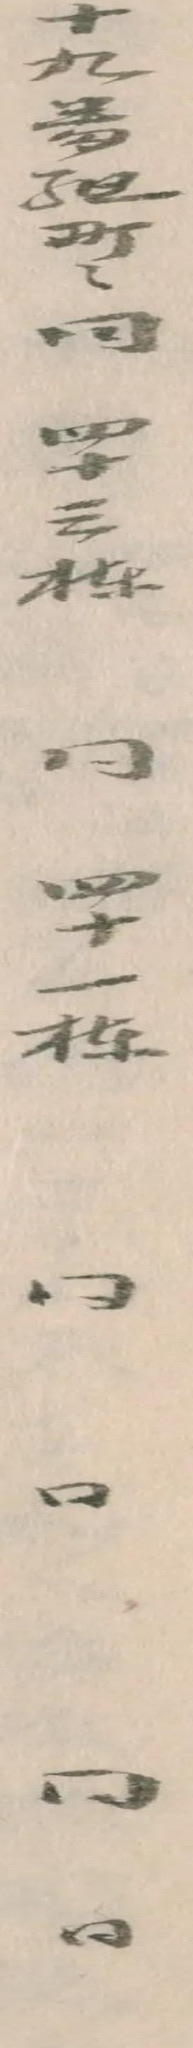十九番組町々同四十三棟同四十一棟同同同同
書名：地災撮要. 巻10(地震之部) 上,下
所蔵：国立国会図書館 National Diet Library, JAPAN
